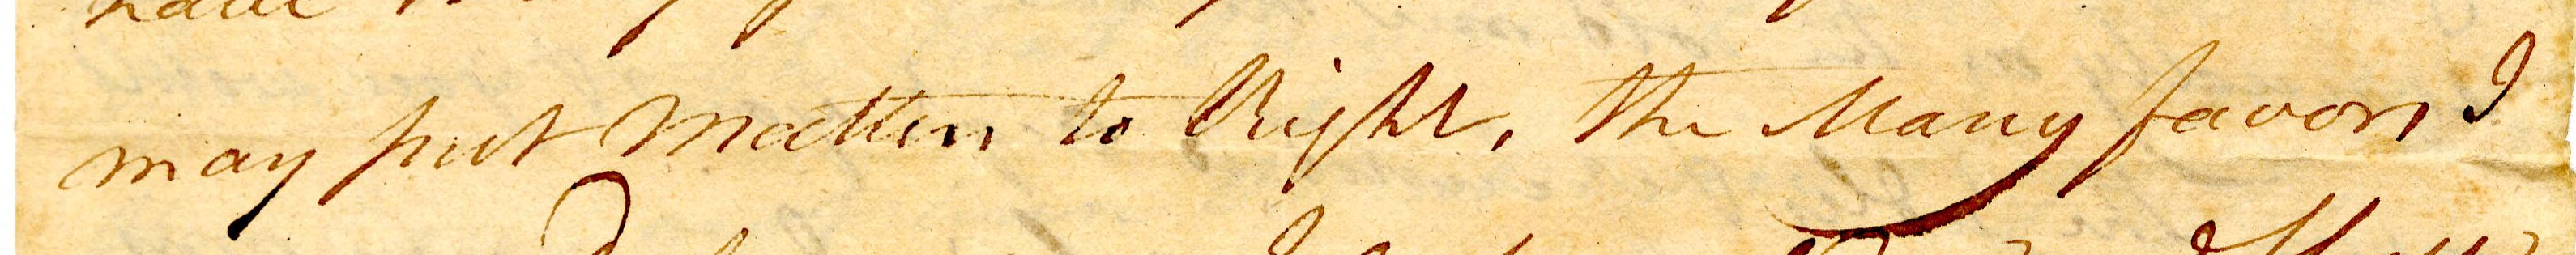may put matter to Right, the Many favors I
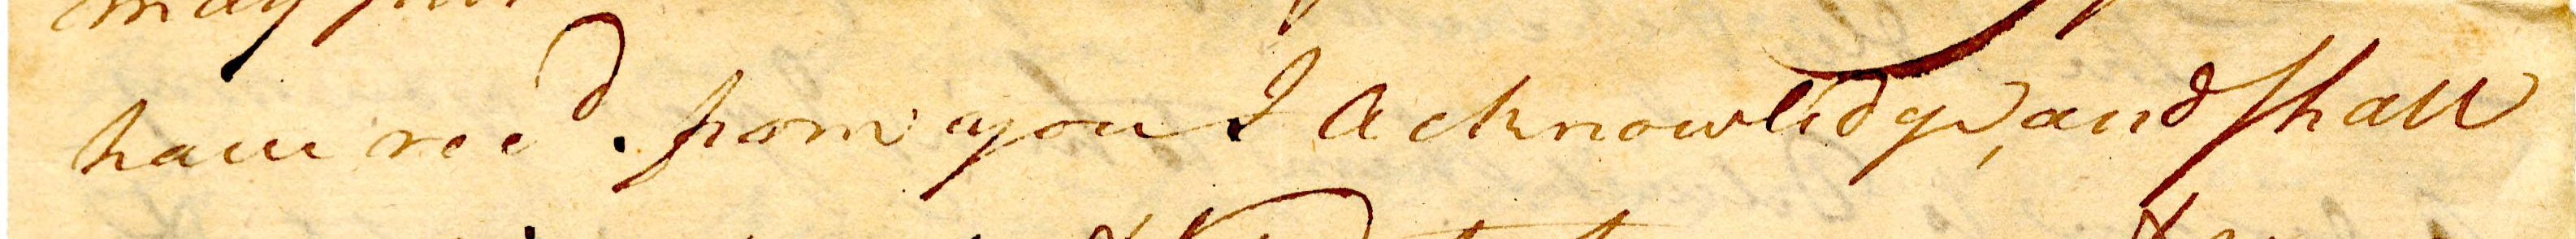have rec^d from you I Acknowledge, and shall
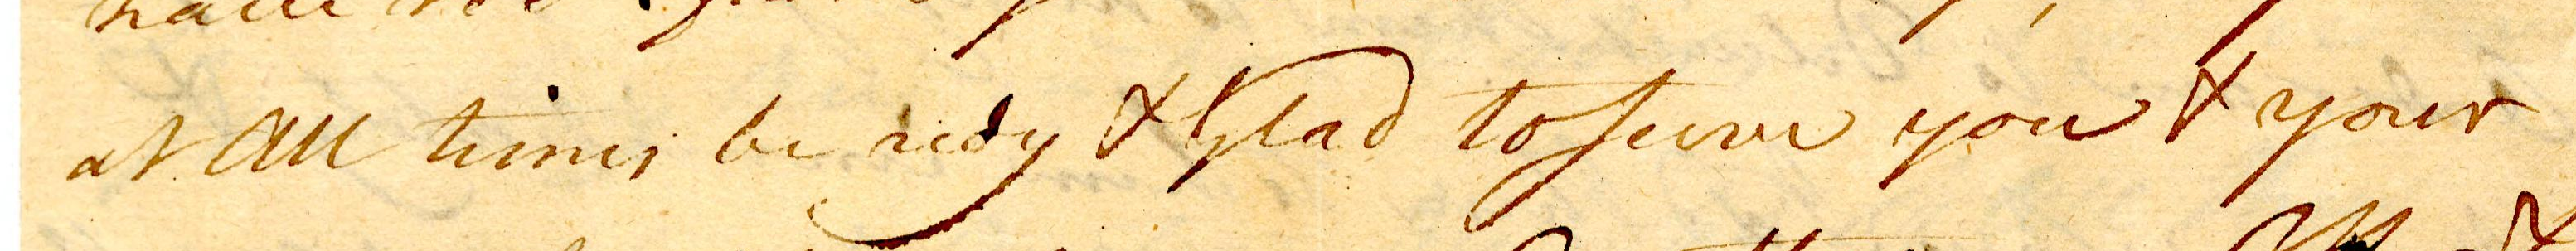at All times be redy & Glad to serve you & your
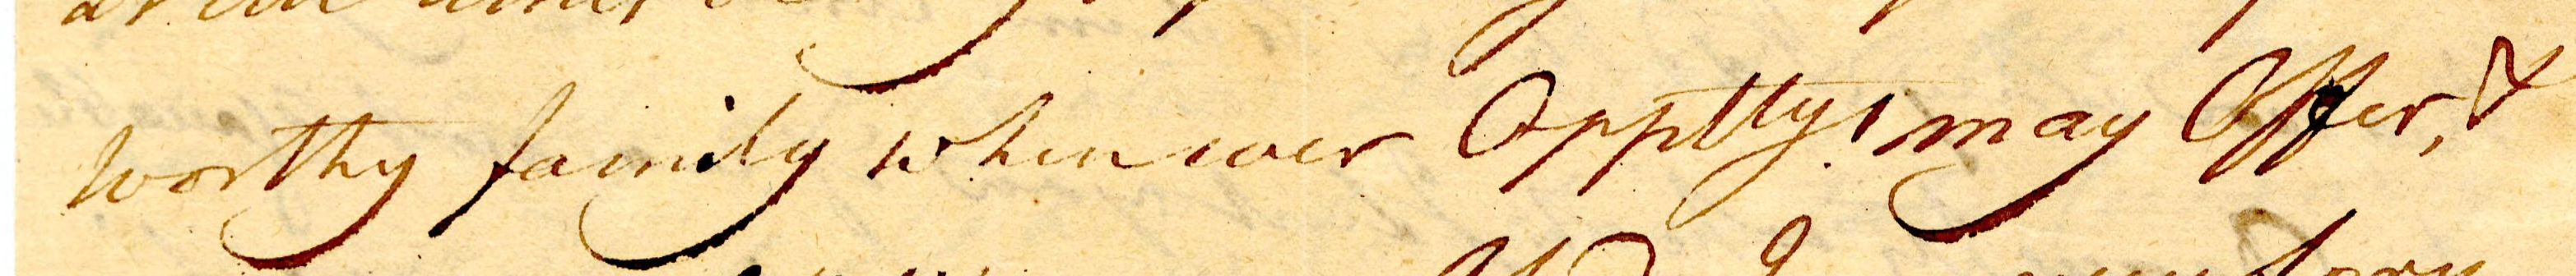worthy family when ever Opp^ty may Offer &
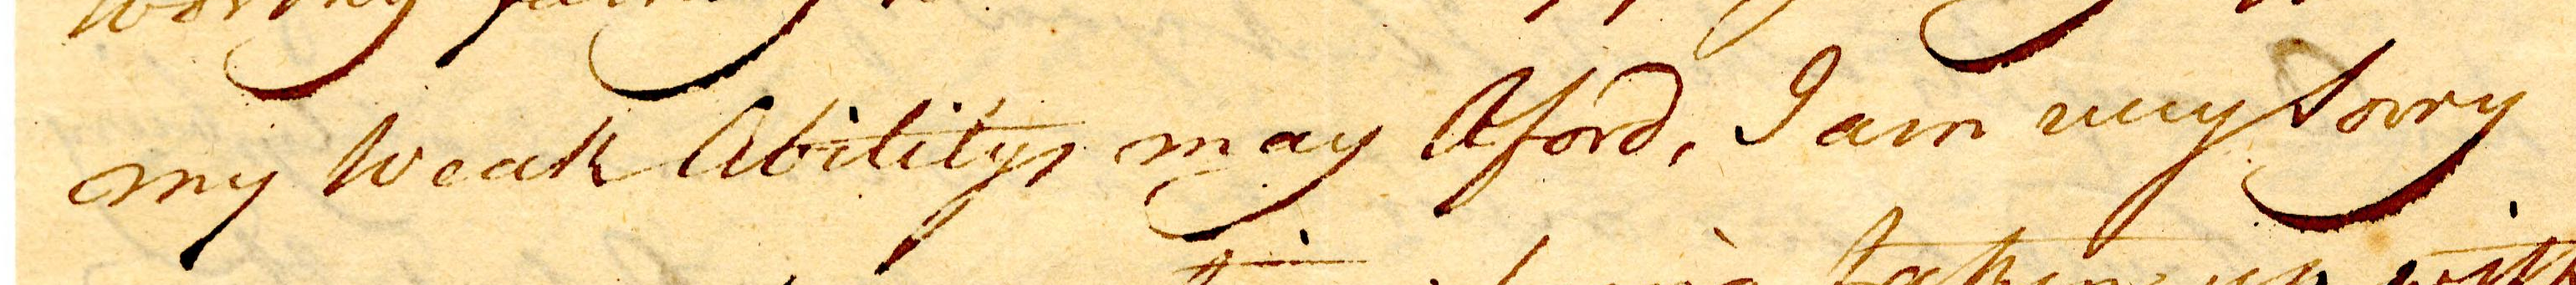my weak Abilitys may Aford, I am very Sorry
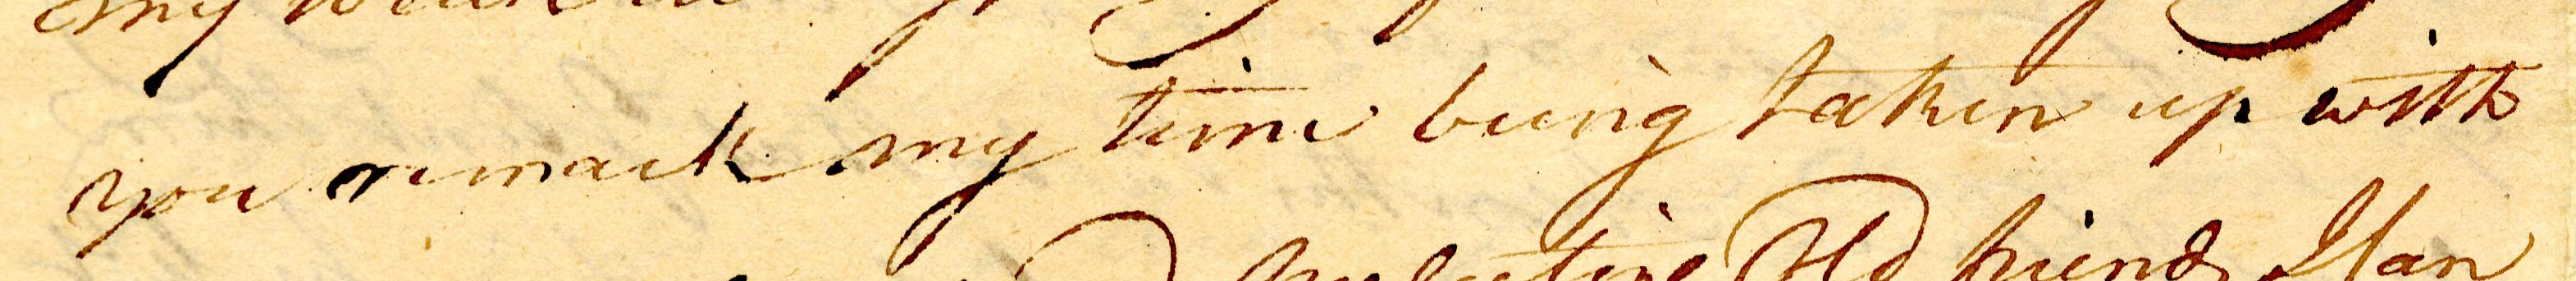you remark my time being taken up with
